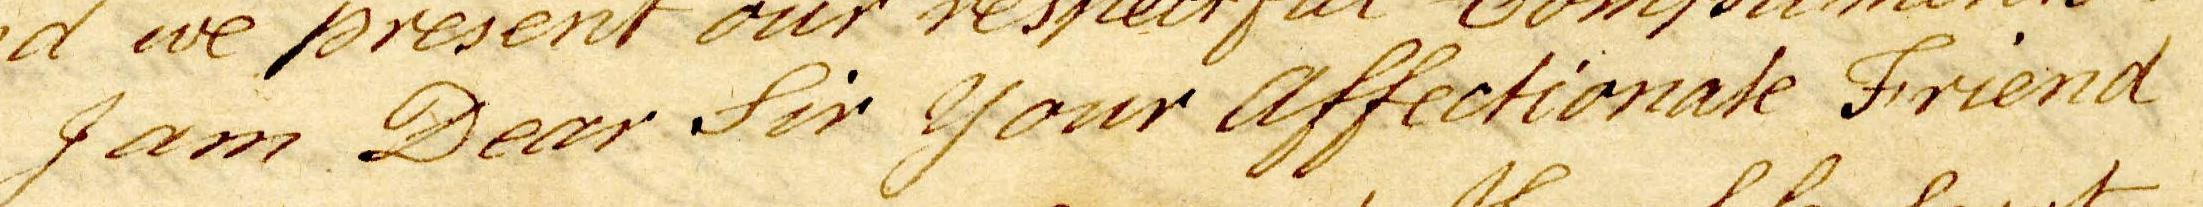I am Dear Sir Your Affectionate Friend
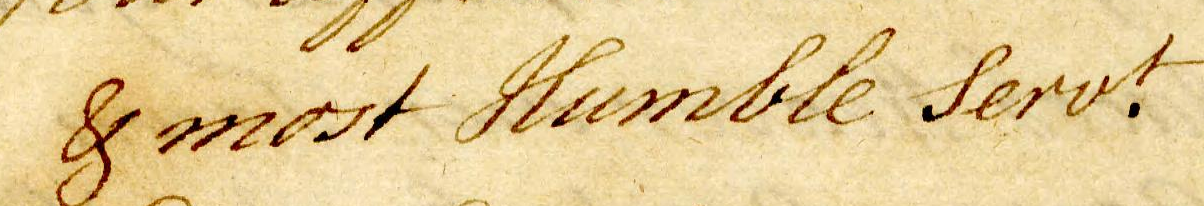& most Humble Serv^t.
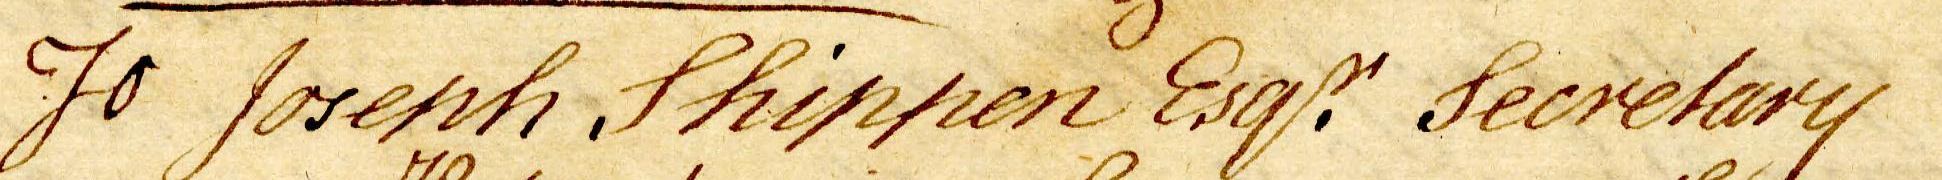To Joseph Shippen Esq^r. Secretary
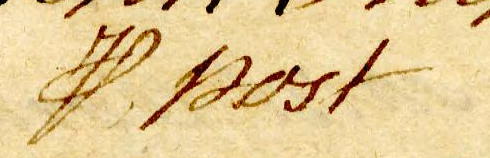per Post
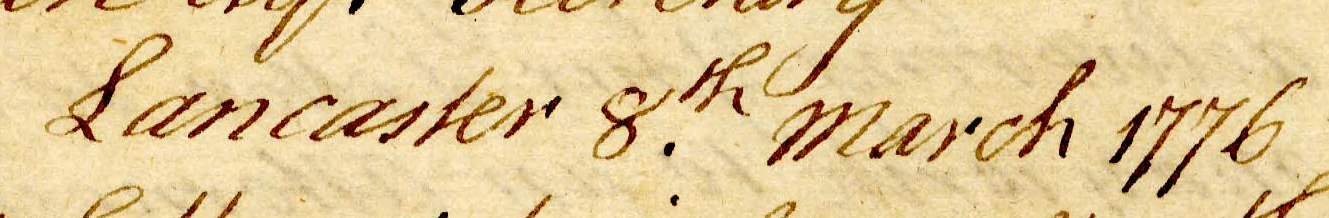Lancaster 8^th. March 1776
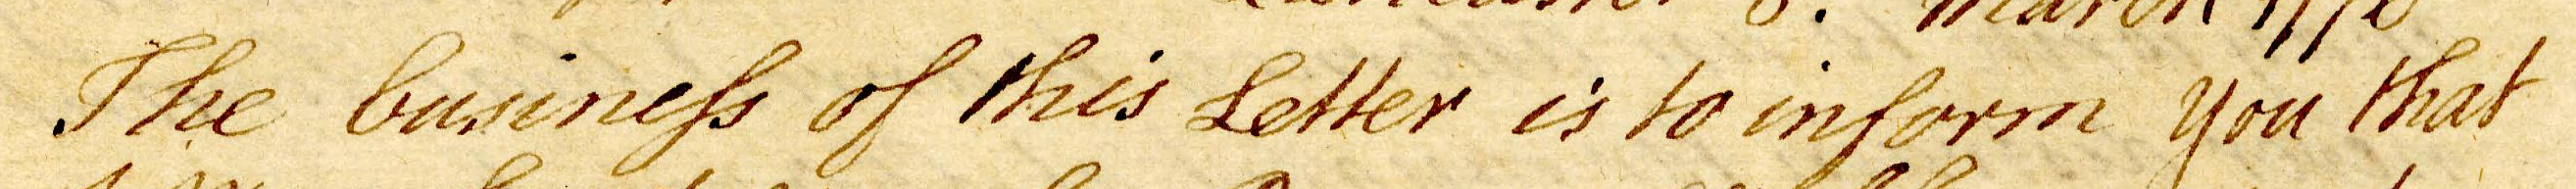The business of this Letter is to inform You that
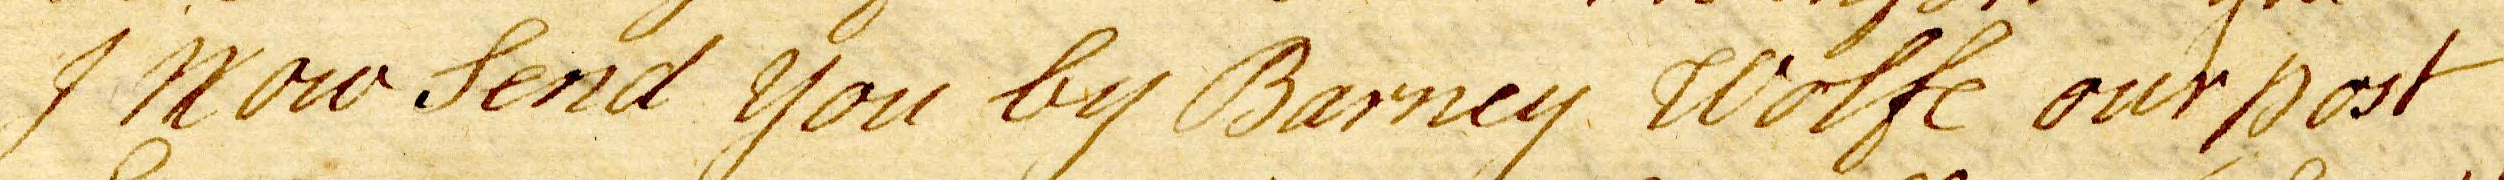I Now Send You by Barney Wolfe our post
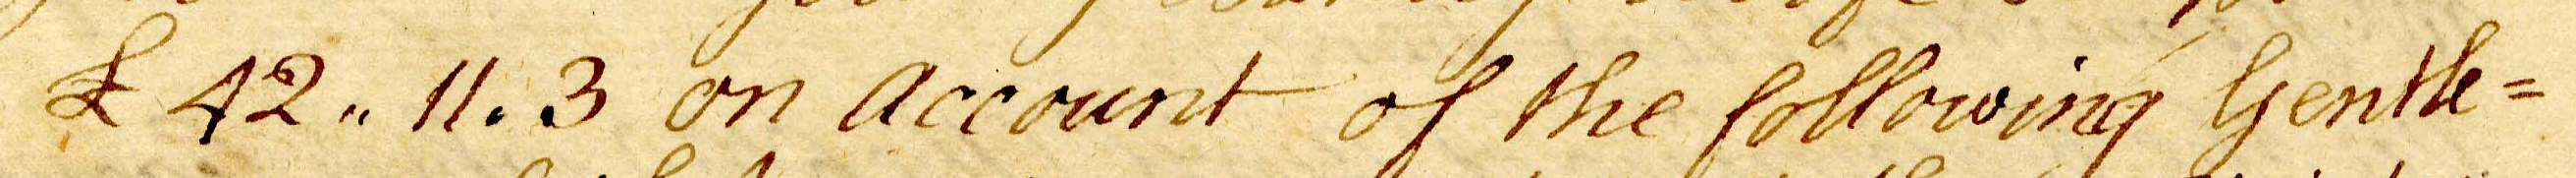£42..11.3 on Account of the following Gentle-
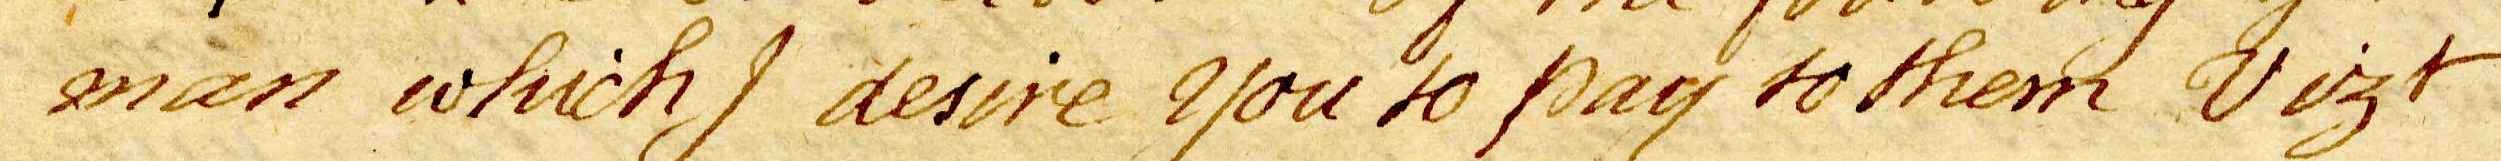man which I desire You to pay to them Vizt
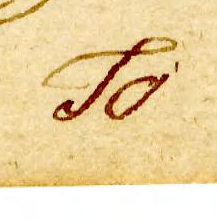To
